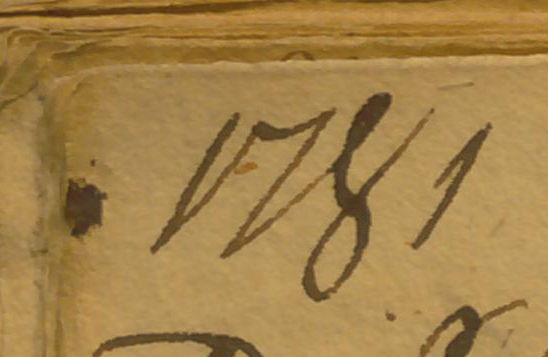1781
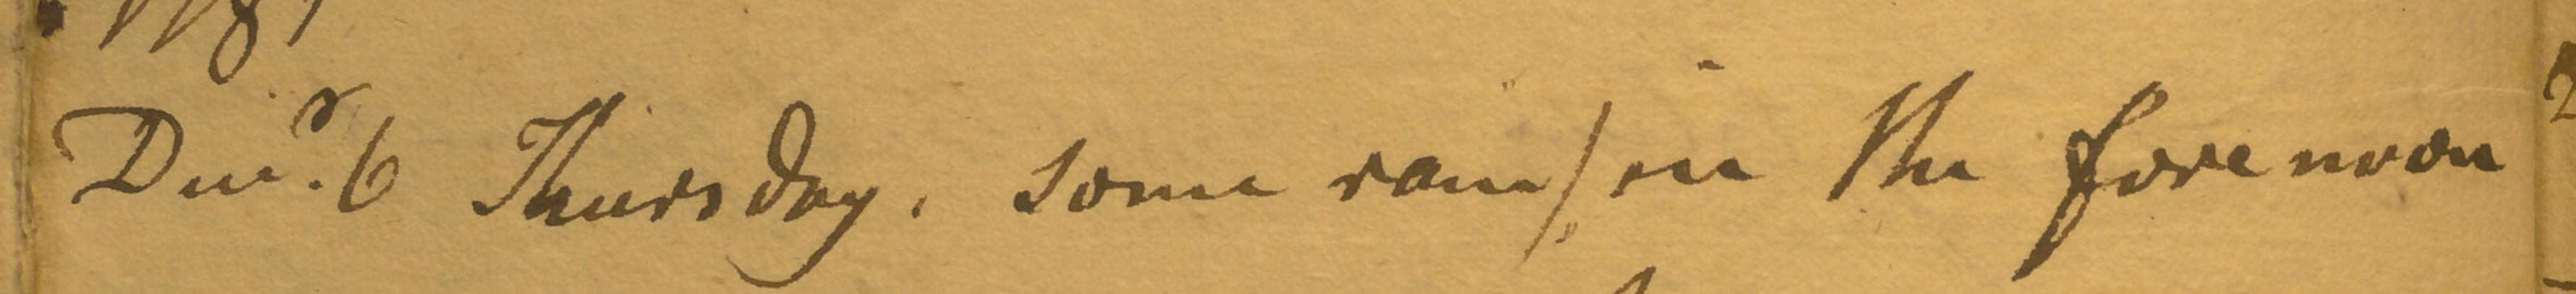Dec^r. 6 Thursday. some rain) in the forenoon
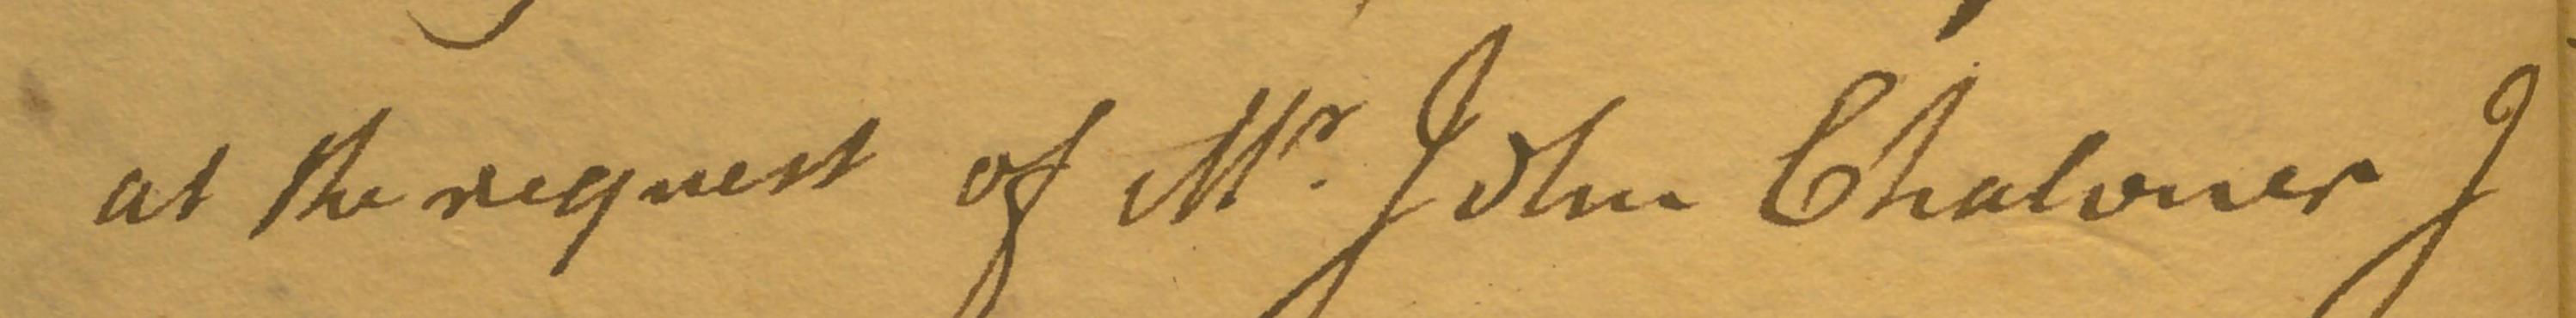at the request of M^r. John Chaloner I
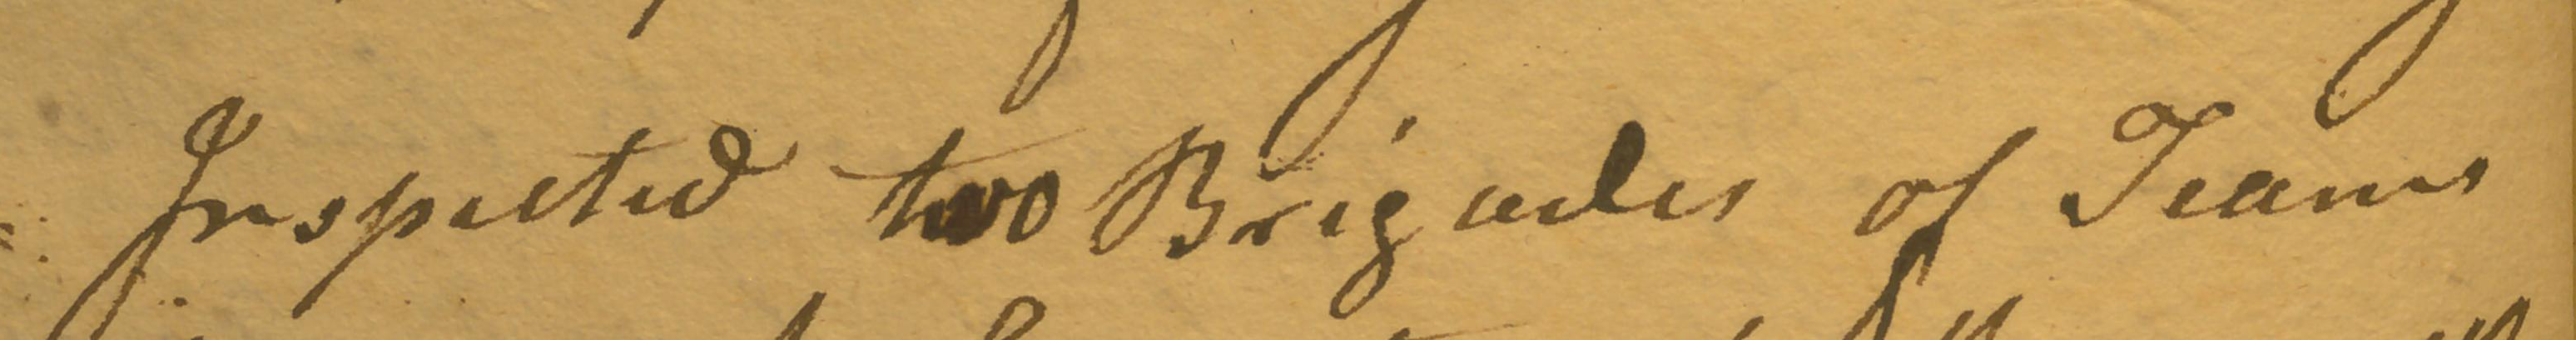Inspected two Brigades of Teams
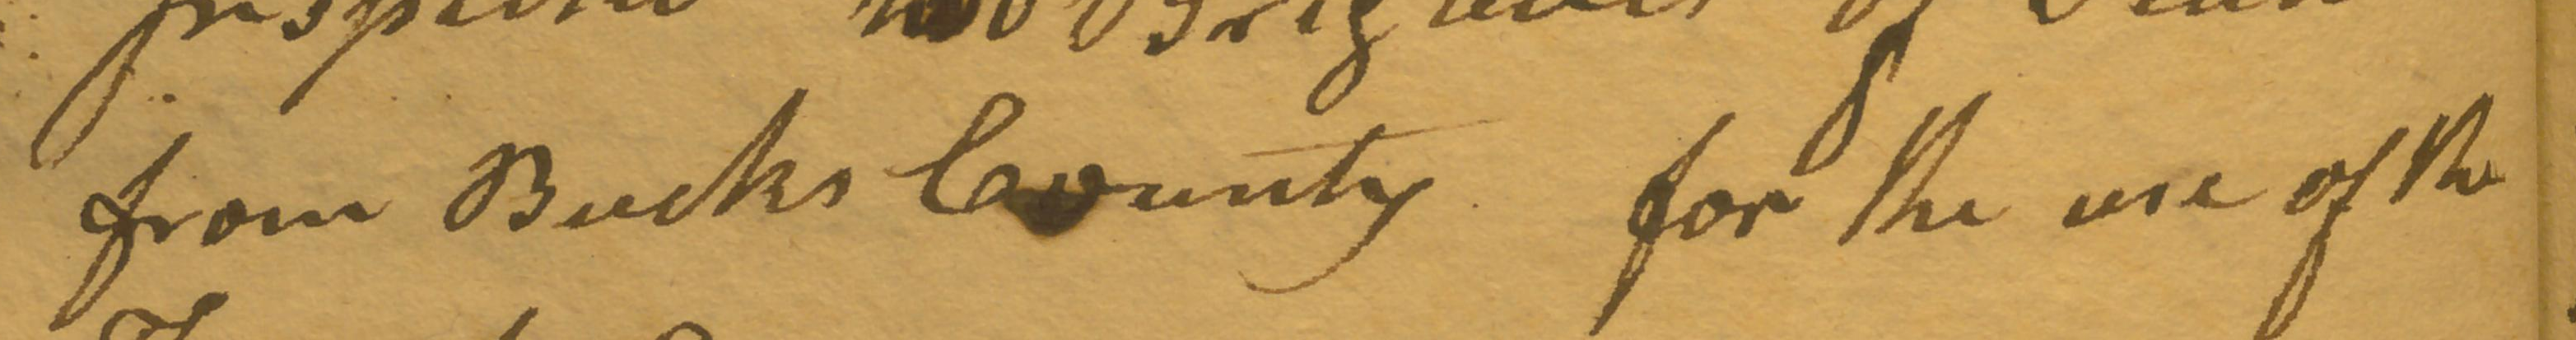from Bucks County for the use of the
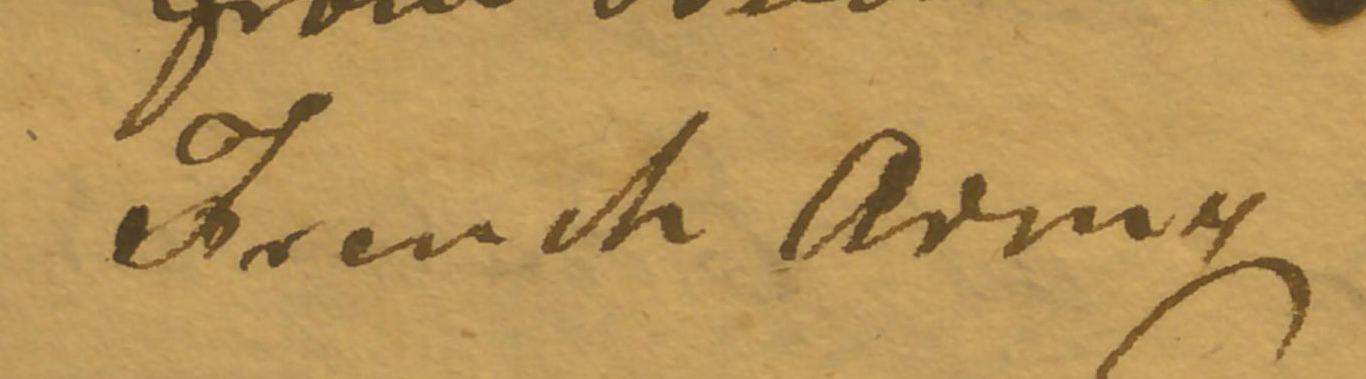French Army
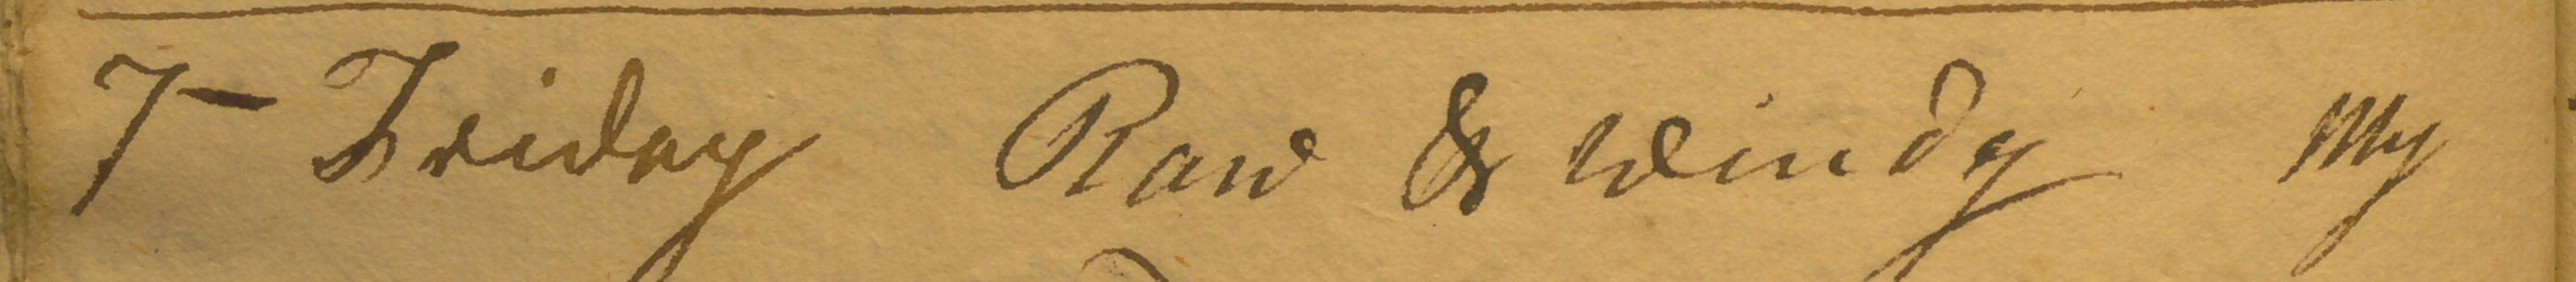7 Friday Raw & windy My
